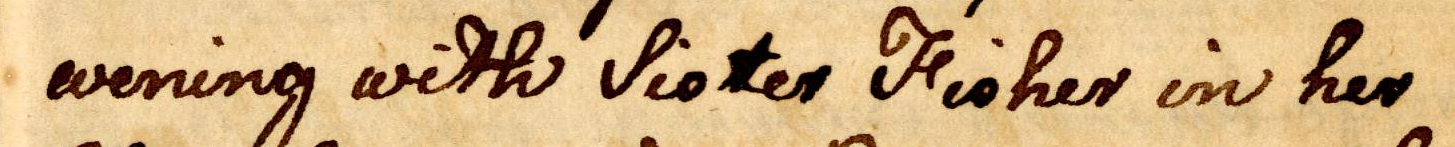evening with Sister Fisher in her
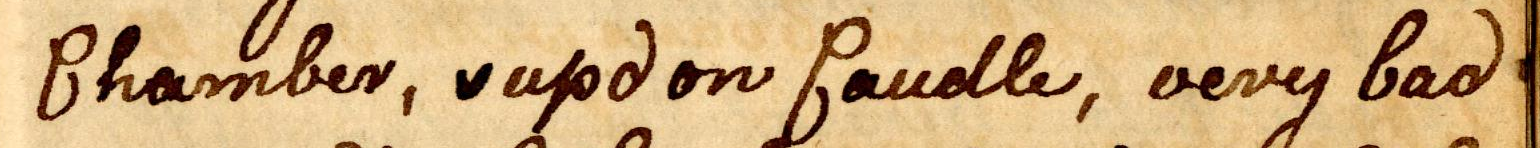Chamber, supd on Caudle, very bad
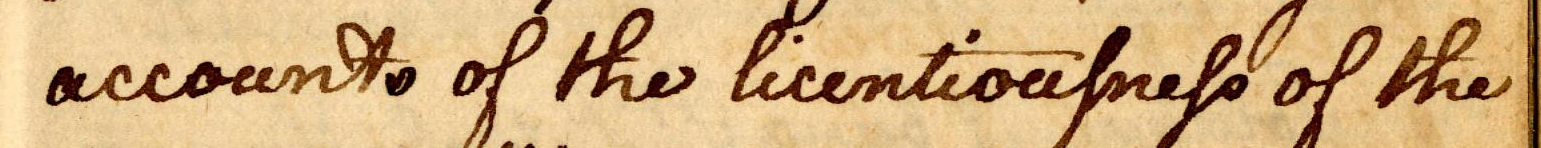accounts of the licentiousness of the
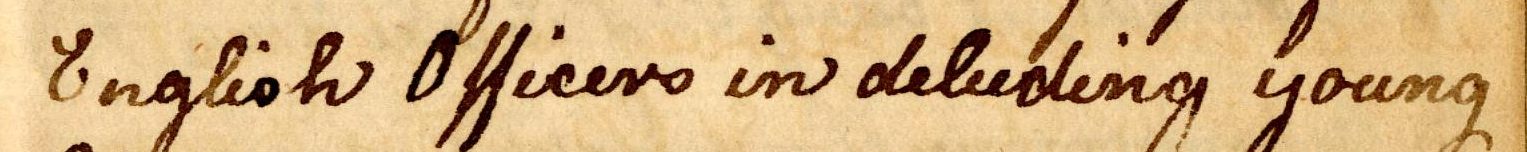English Officers in deluding young
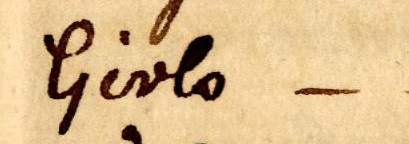Girls-
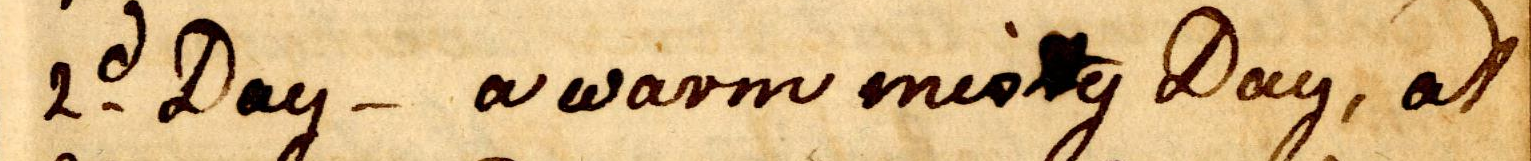2^d. Day- a warm misty Day, at
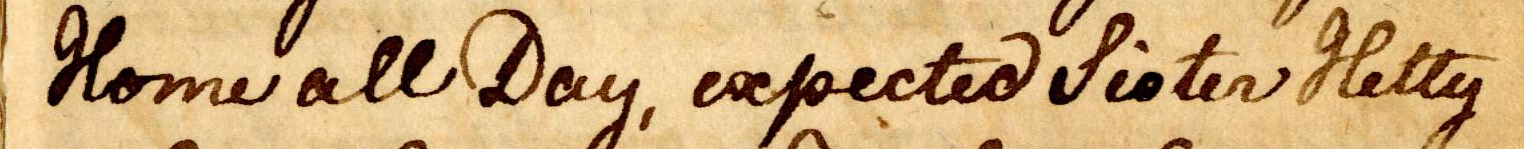Home all Day, expected Sister Hetty
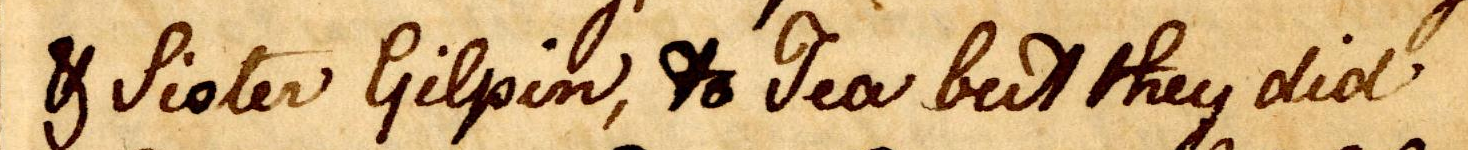& Sister Gilpin, to Tea but they did
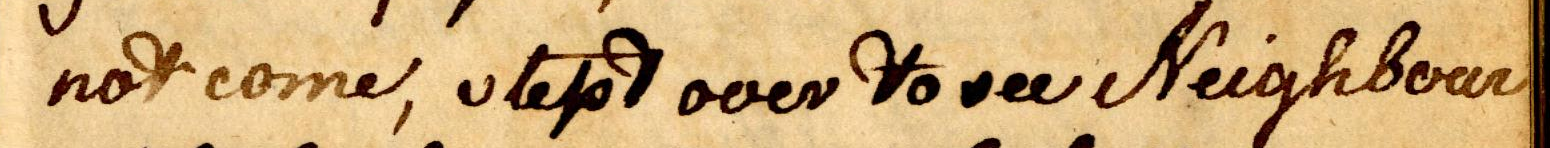not come, stept over to see Neighbour
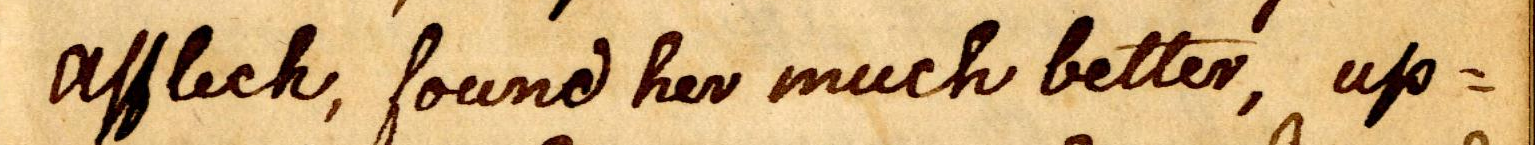Affleck, found her much better, up-
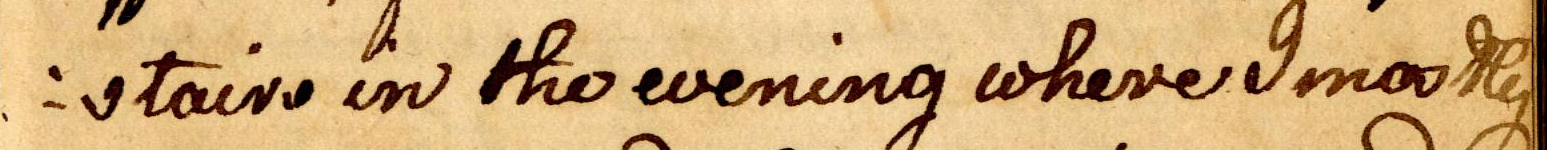-stairs in the evening where I mostly
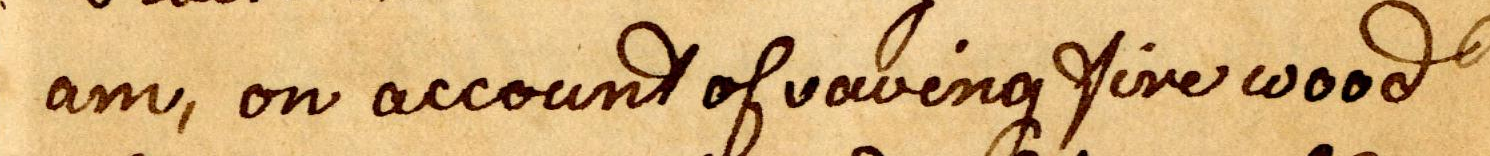am, on account of saving fire wood
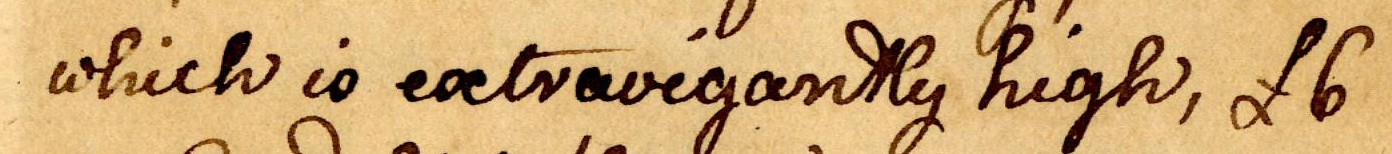which is extravigantly high, £6
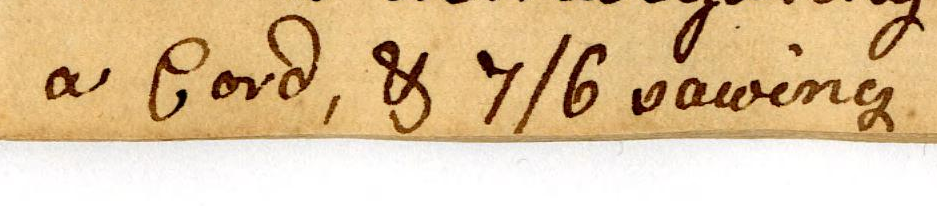a Cord, & 7s6 sawing
